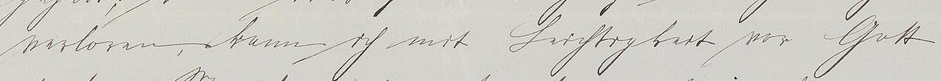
verloren, kann ich mit Leichtigkeit vor Gott
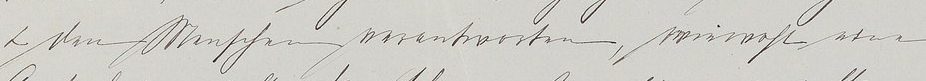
& den Menschen verantworten, wiewohl eine
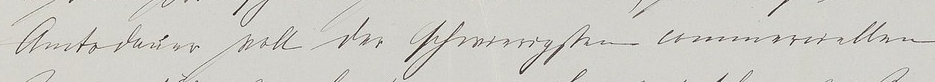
Amtsdauer voll der schwierigsten commerciellen
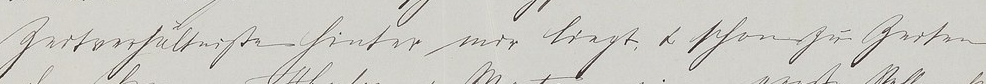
Zeitverhältniße hinter mir liegt & schon zu Zeiten
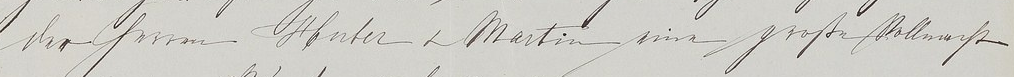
der Herren Huber & Martin eine große Vollmacht
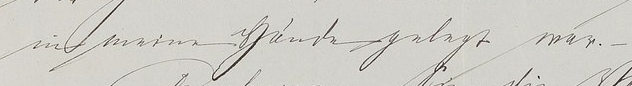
in meine Hände gelegt war. –
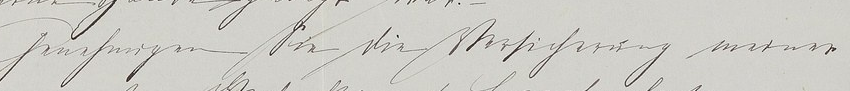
Genehmigen Sie die Versicherung meiner
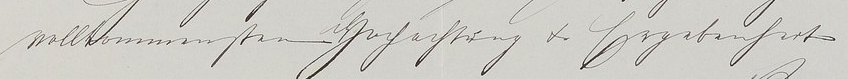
vollkommensten Hochachtung & Ergebenheit
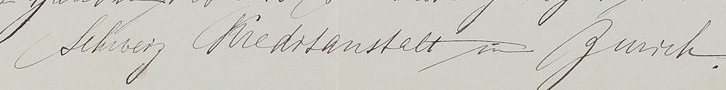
Schweiz Kreditanstalt in Zürich.
